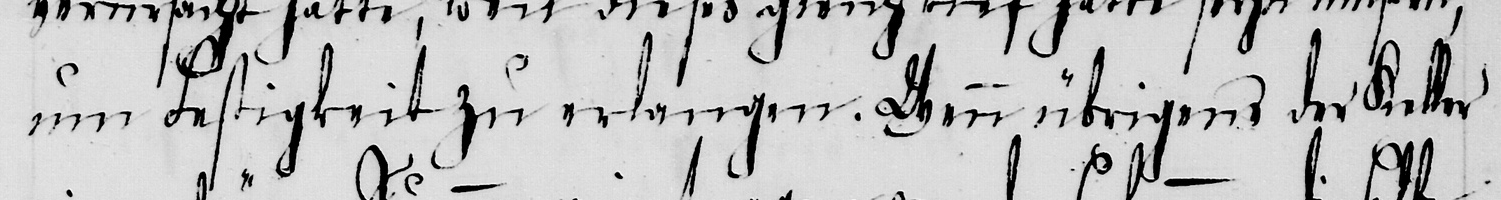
um Festigkeit zu erlangen. Wenn übrigens der Keller
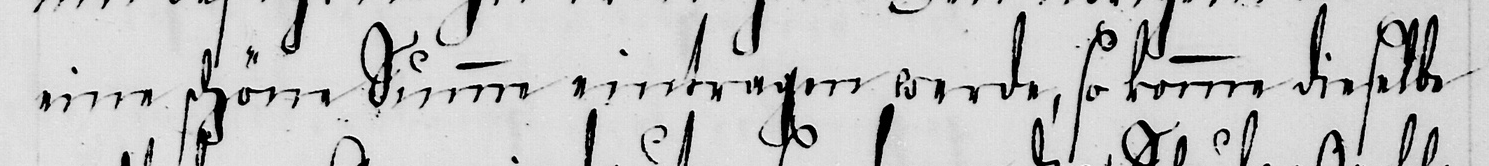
eine schöne Summe eintragen werde, so komme dieselbe
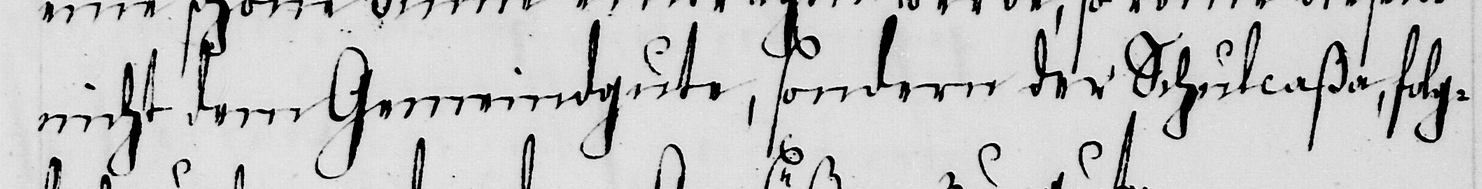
nicht dem Gemeindgute, sondern der Schulcaßa, folg¬
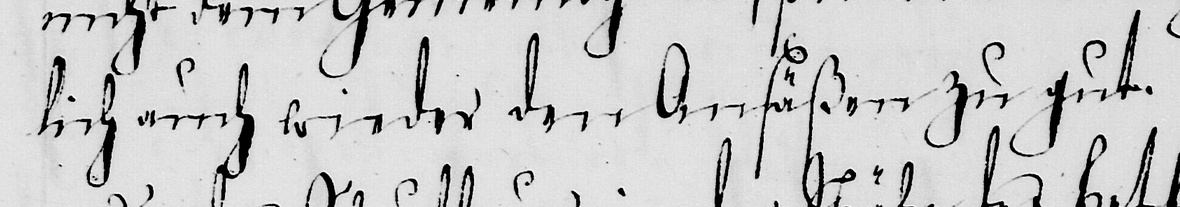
lich auch wieder den Ansäßen zu gut.
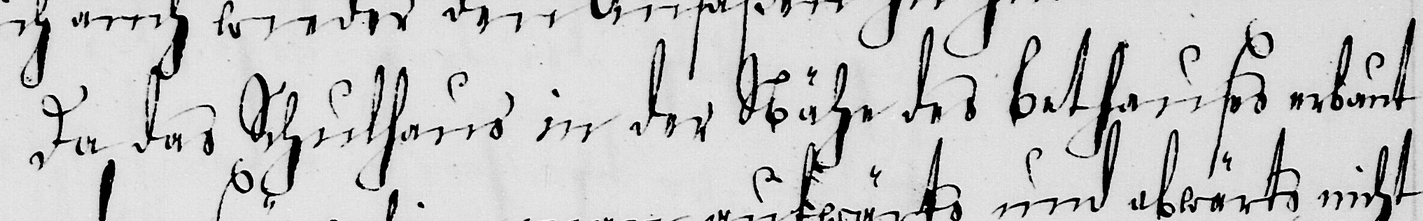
Da das Schulhaus in der Nähe des Bethauses erbaut
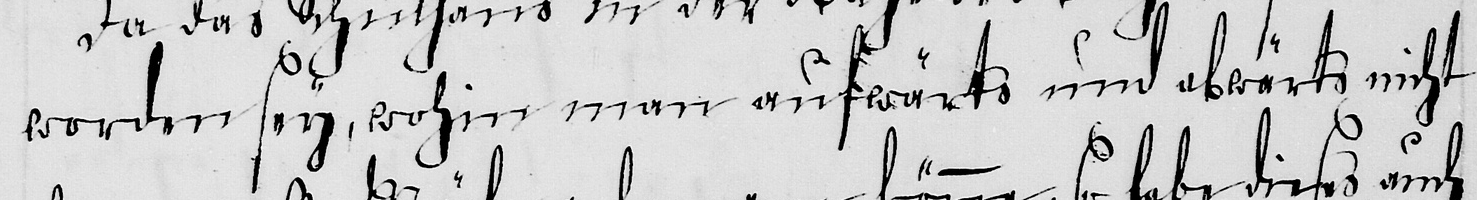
worden sey, wohin man aufwärts und abwärts nicht
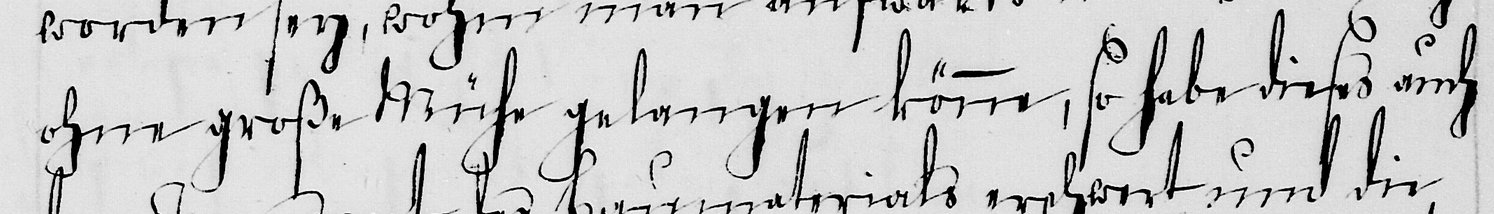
ohne große Mühe gelangen könne, so habe dieses auch
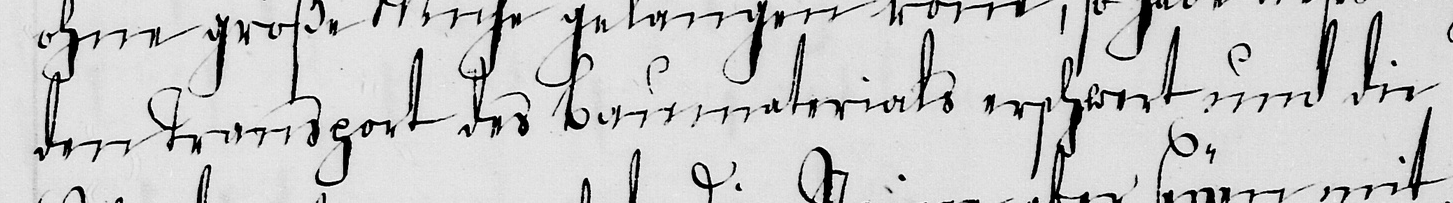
den Transport des Baumaterials erschwert und die
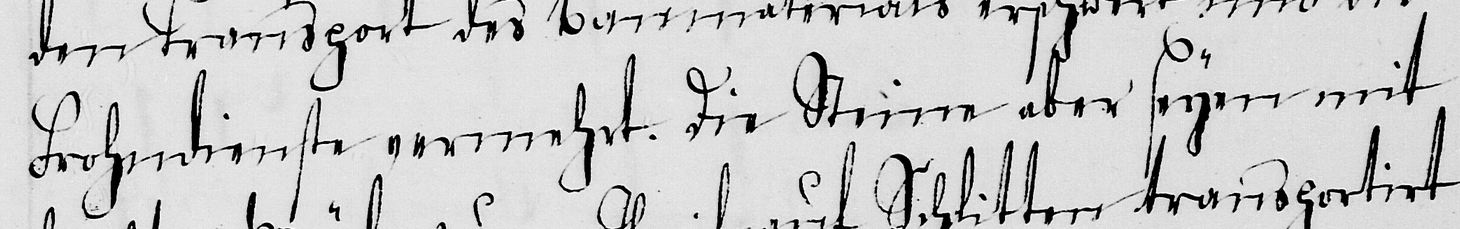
Frohndienste vermehrt. Die Steine aber seyen mit
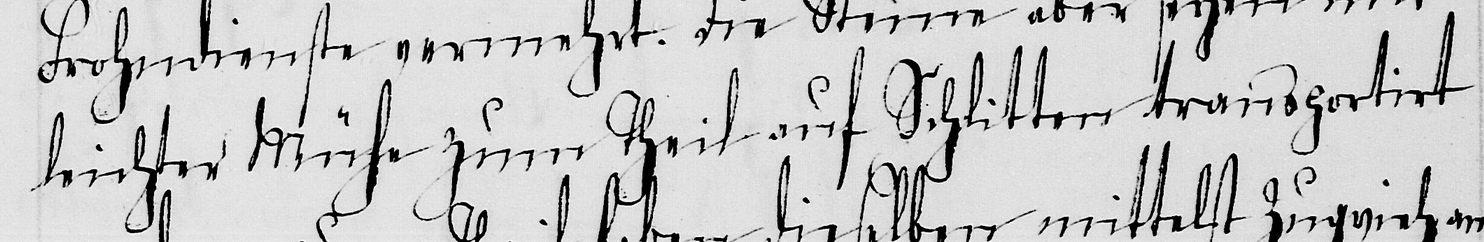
leichter Mühe zum Theil auf Schlitten transportirt
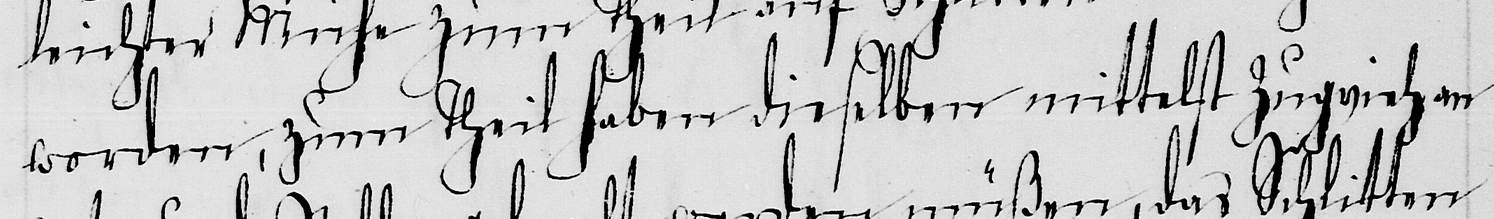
worden, zum Theil haben dieselben mittelst Zugvieh an
